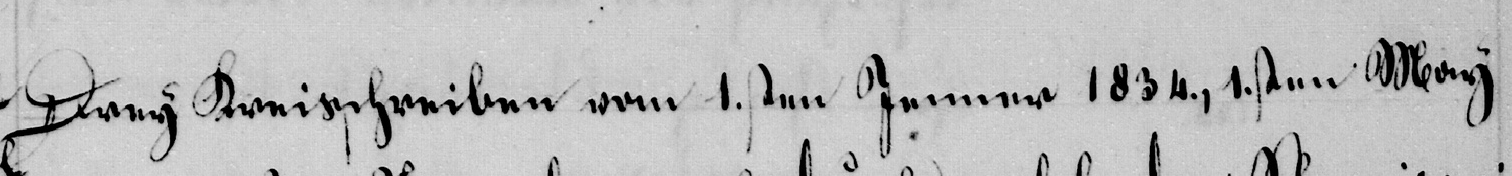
Drey Kreisschreiben vom 1.sten Jenner 1834., 1.sten May
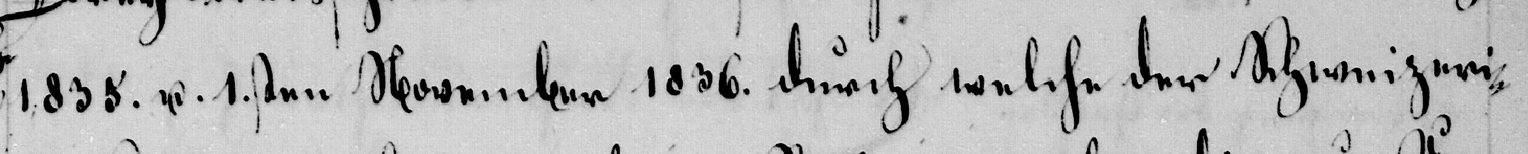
1835. u. 1.sten November 1836. durch welche der Schweizeris¬
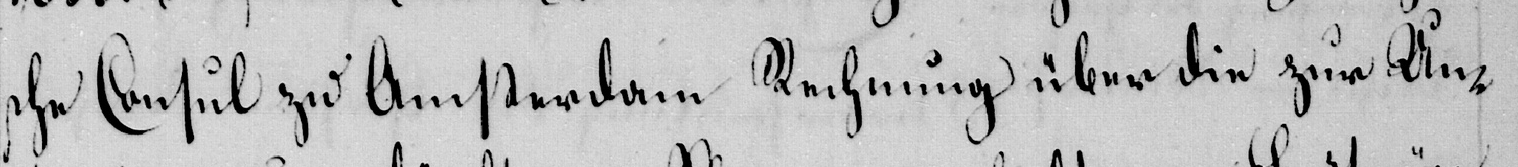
che Consul zu Amsterdam Rechnung über die zur Un¬
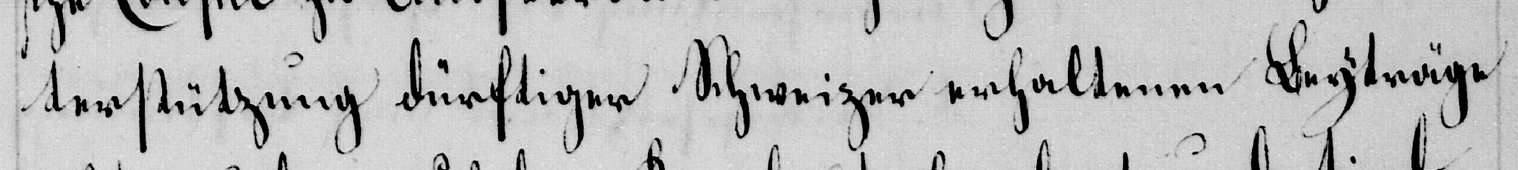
terstützung dürftiger Schweizer erhaltenen Beyträge
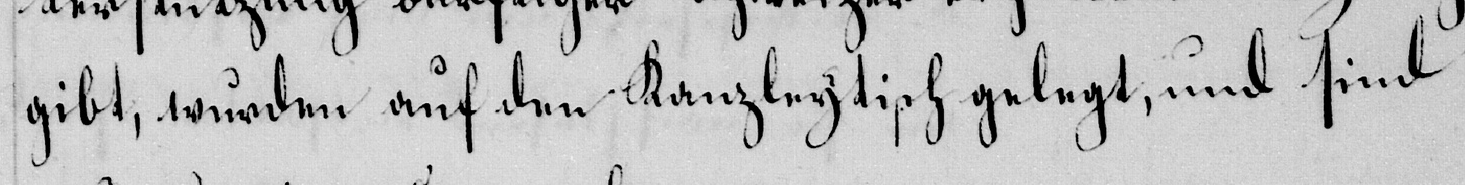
gibt, wurden auf den Kanzleytisch gelegt, und sind
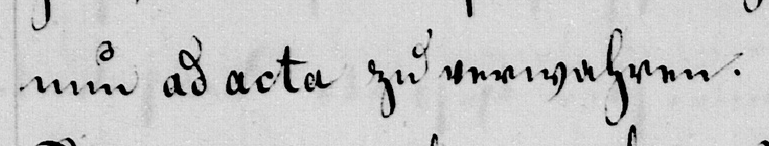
nun ad acta zu verwahren.
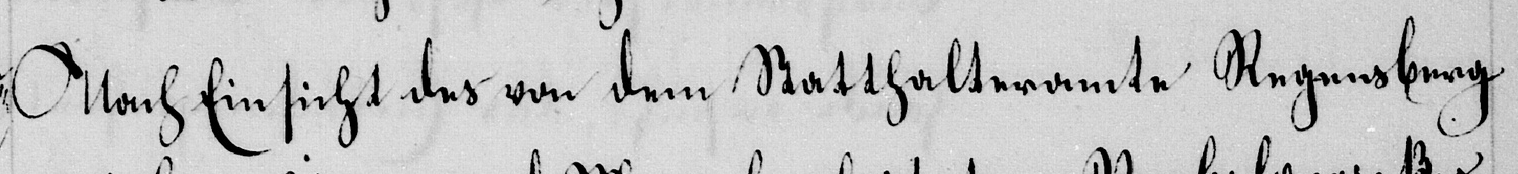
Nach Einsicht des von dem Statthalteramte Regensberg
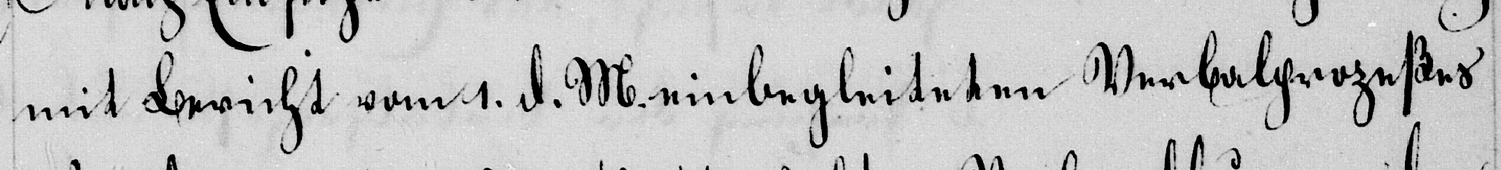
mit Bericht vom 1. d. M. einbegleiteten Verbalprozeßes
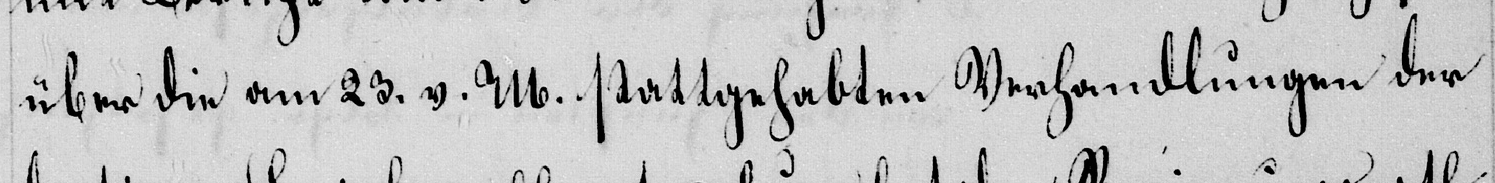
über die am 23. v. M. stattgehabten Verhandlungen der
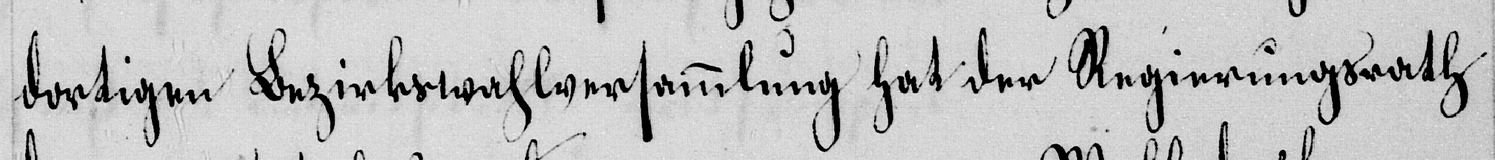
dortigen Bezirkswahlversammlung hat der Regierungsrath
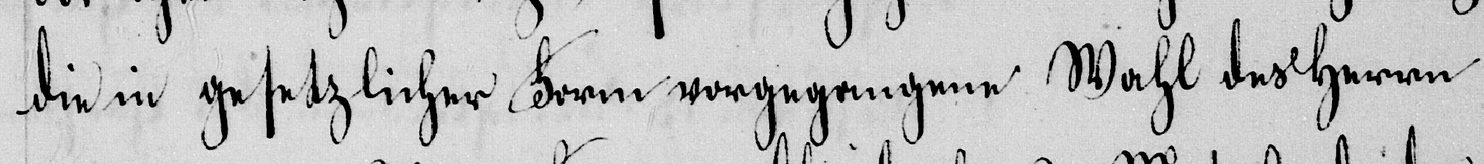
die in gesetzlicher Form vorgegangene Wahl des Herrn
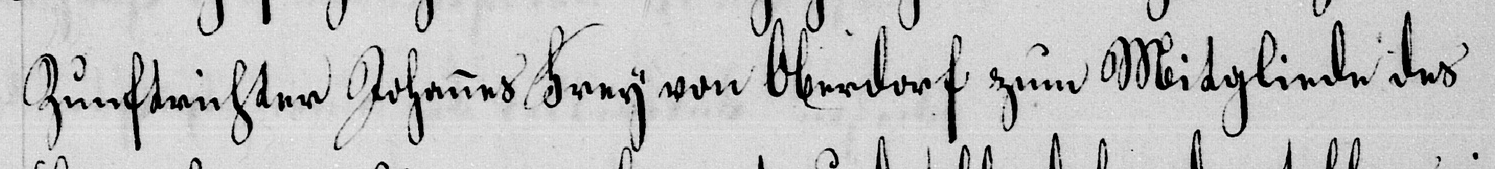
Zunftrichter Johannes Frey von Oberdorf zum Mitgliede des
